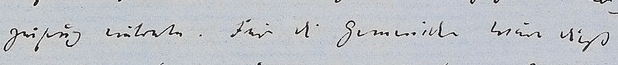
zinsung eintrete. Für die Gemeinden wäre dieß
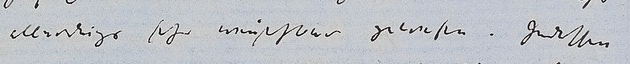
allerdings sehr wünschbar gewesen. Indessen
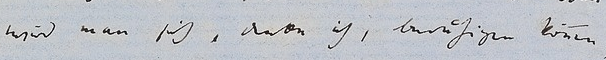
wird man sich, denke ich, beruhigen können,
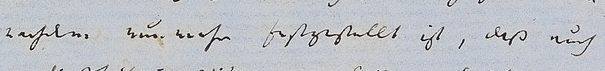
nachdem nunmehr festgestellt ist, daß auch
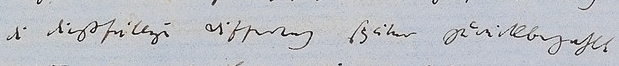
die dießfällige Differenz später zurückbezahlt
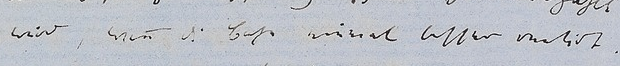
wird, wenn die Bahn einmal besser rentirt.
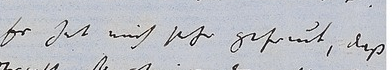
Es hat mich sehr gefreut, daß
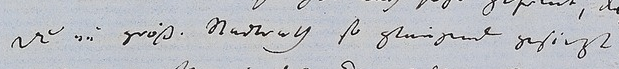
Du im größ. Stadtrath so zwingend gesiegt
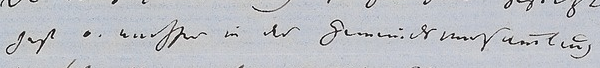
hast &. nachher in der Gemeindsversammlung.
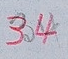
Rathe.
